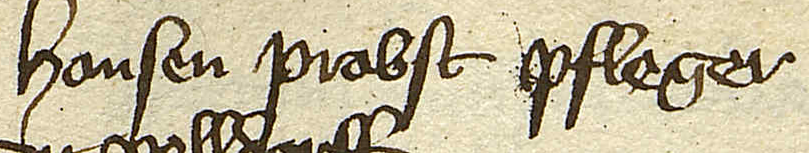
Hanſen Probſt Pfleger
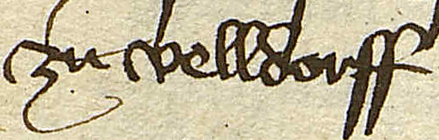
cʒu velldorff
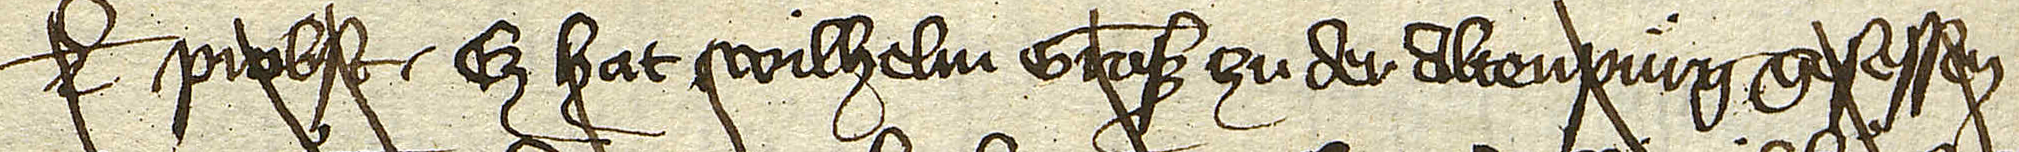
L* probſt / Eʒ hat wilhelm Groſʒ cʒu der Altenpürg geſeſſen
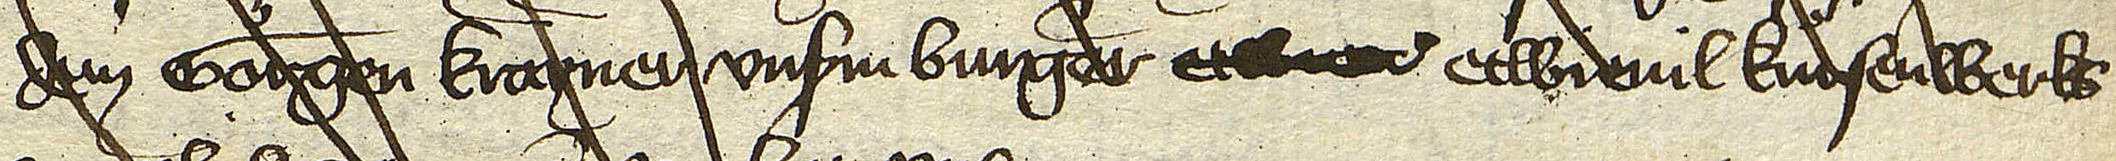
dem Görgen Krayner vnſ*m burger etwieu etwieuil kürſenwerks
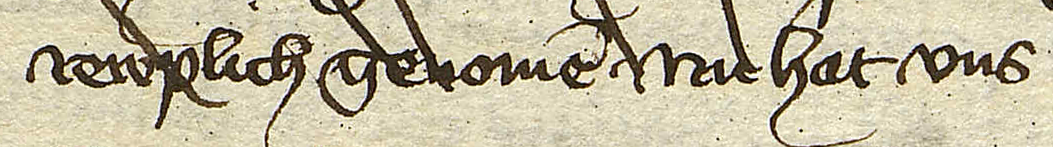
rewplich genome* / Nu hat vns
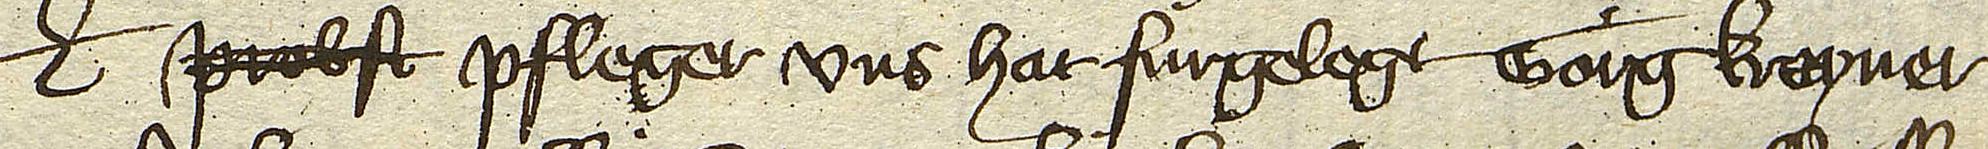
L* Probſt Pfleger vns hat fürgelegt Görg Kreyner
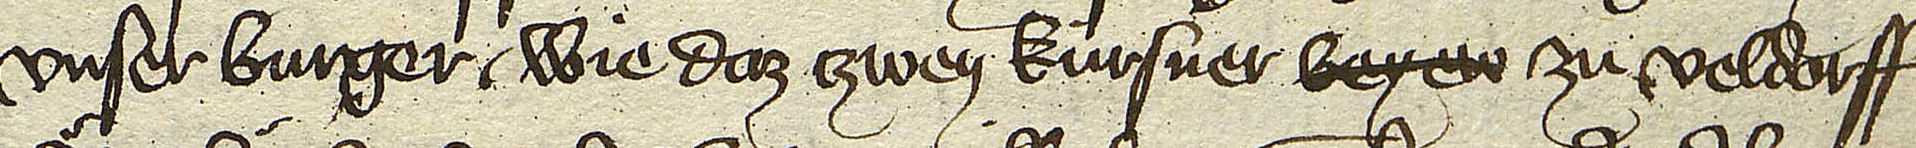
vnſer burger / wie daʒ cʒwey kürſner bey ew cʒu veldorff
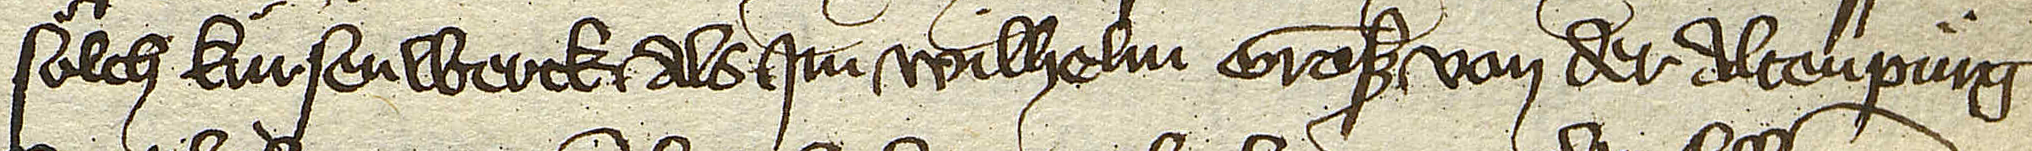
ſölich kürſenwerck / Als Im wilhelm Groſʒ von der Altenpürg
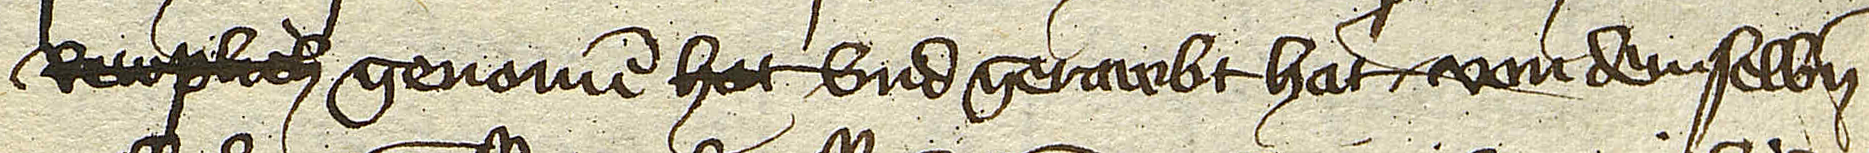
Rewplich genome* hat vnd gerawbt hat / von demſelbn*
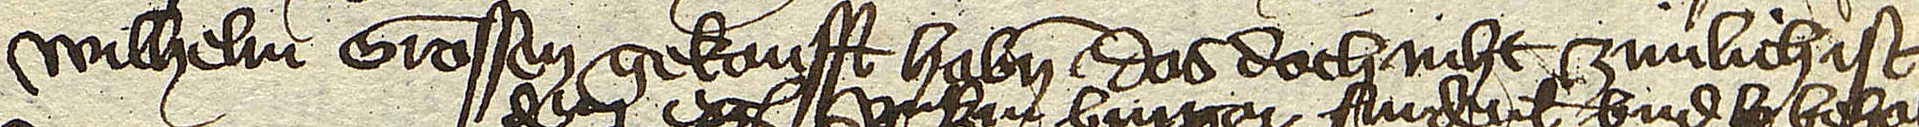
wilhelm Groſſen gekaufft habn* / das niht cʒimlich iſt
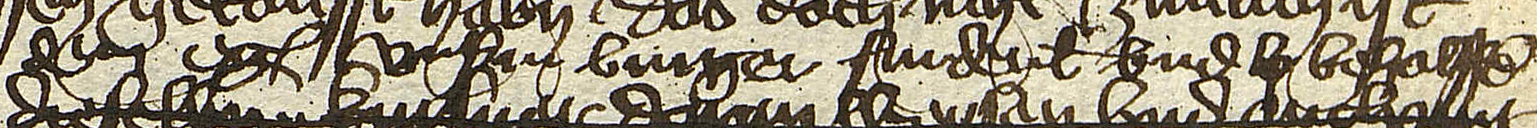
dem eg* vnſ*m burger furderl* vnd b beholffe*
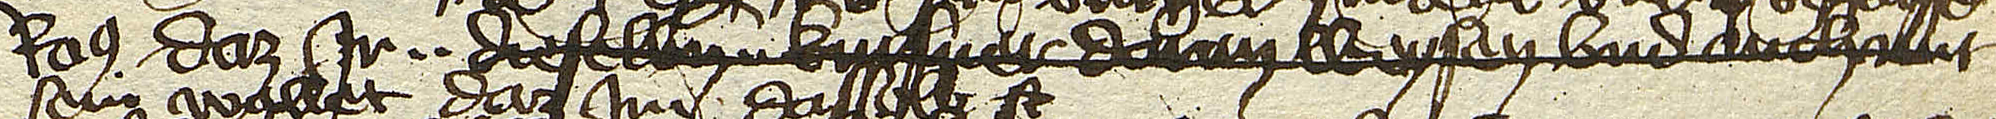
Ro* / daʒ Ir ~ dieſelbn ~ Kurſner daran weyſen vnd auch mit
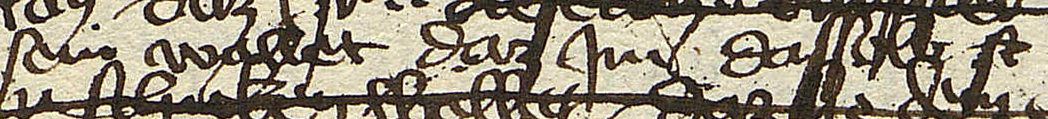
ſein wollet daʒ Im daſſelb ſe
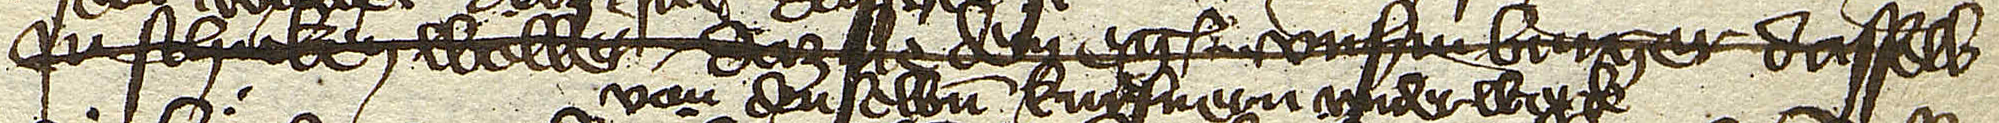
In ſchicken wöllet / daʒ ſie dem eg* ~vnſ*m burger daſſelb
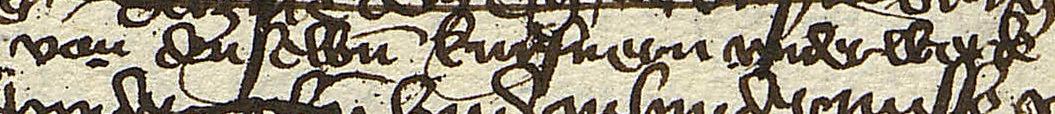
von denſelbn* kurſnern wider werde
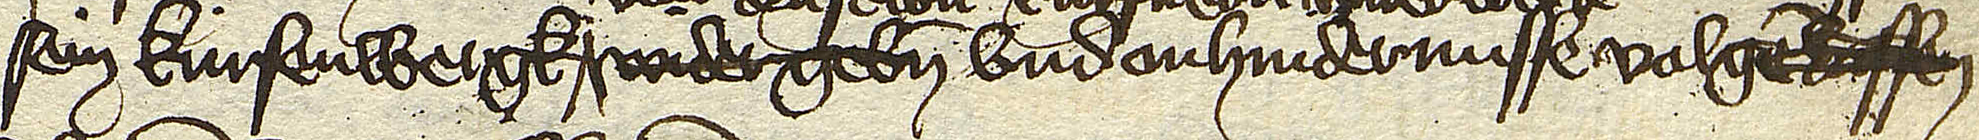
ſein Kürſenwergk wider gebn* vnd onhindernüſſe volge* laſſen
